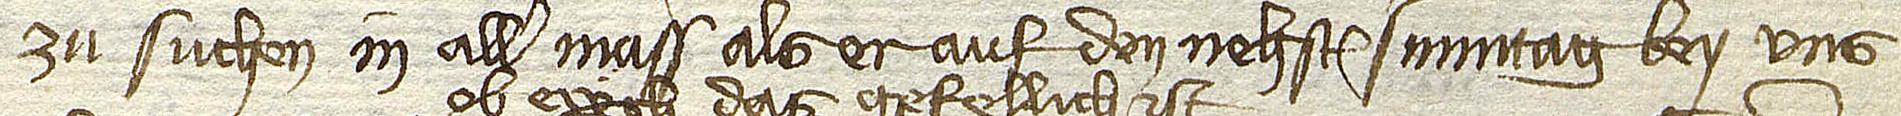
ʒu ſuchen in all* maſſ als er auf den nehſt* ſunntag bey vns
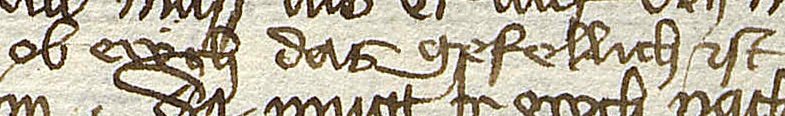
ob ewch das gefellich iſt
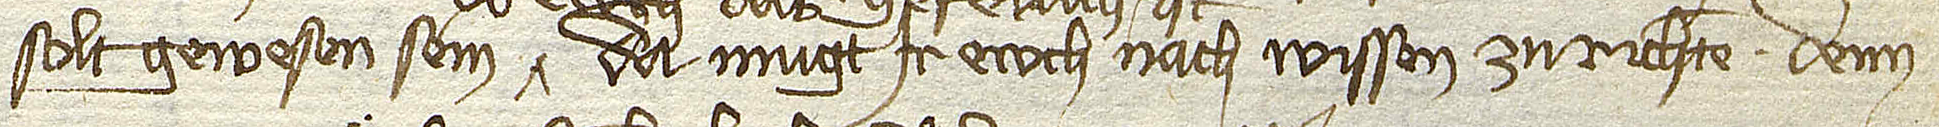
ſolt geweſen ſein Da mugt Ir ewch nach wiſſen ʒu richte* . Denn
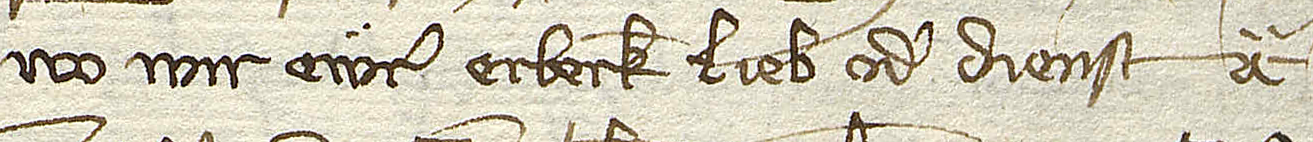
wo wir ew*r erberk* lieb od* dienſt ec*
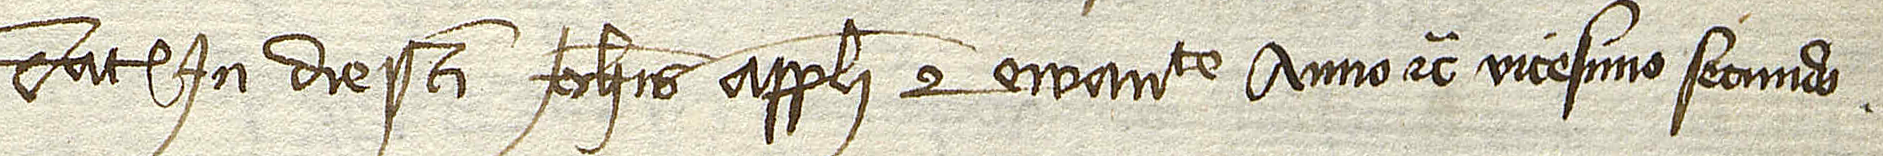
Dat* die ſti* Ioh*is appli @ ewan* Anno ec* viceſimo ſecundo
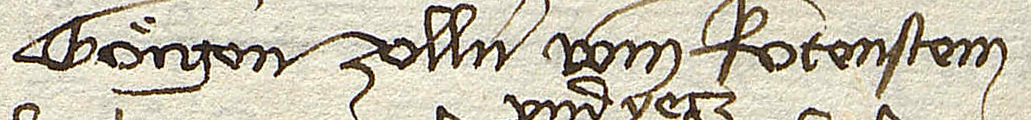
Görgen ʒolln* vom* Rotenſtein
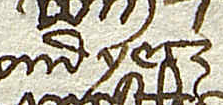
vnd yecʒ
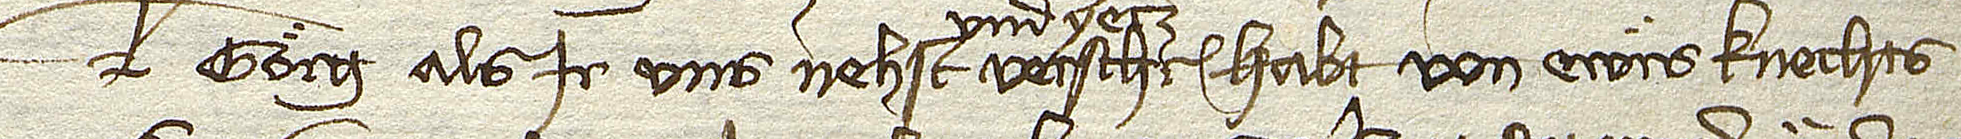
L* Görg als Ir vns nehſt verſchr* habt von ewrs knechts
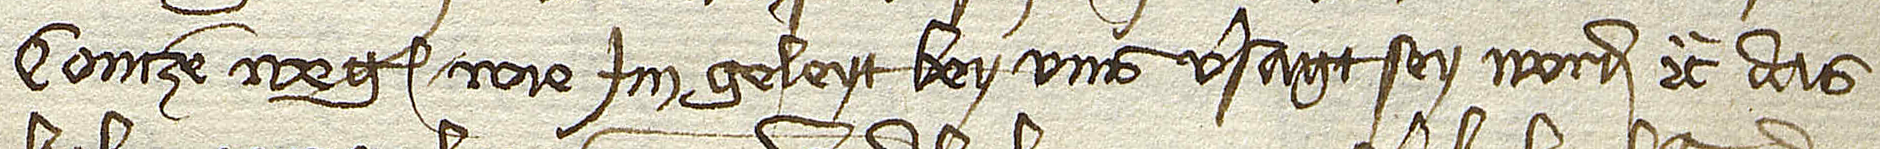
Concʒe* weg* wie Im geleyt bey vns v*ſagt ſey word* ec* das
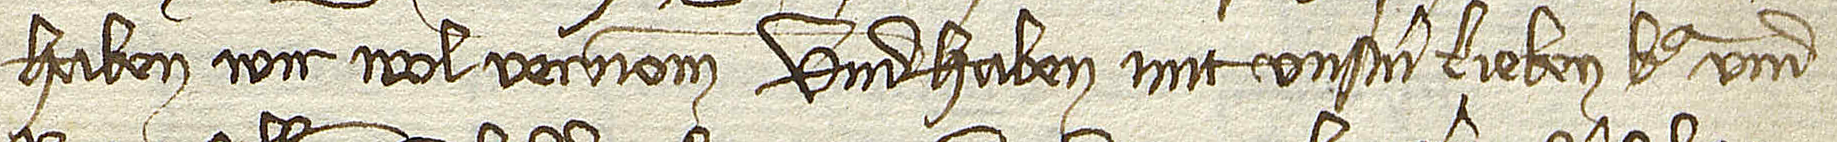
haben wir wol vernom* Vnd haben mit vnſ*n lieben b* vnd
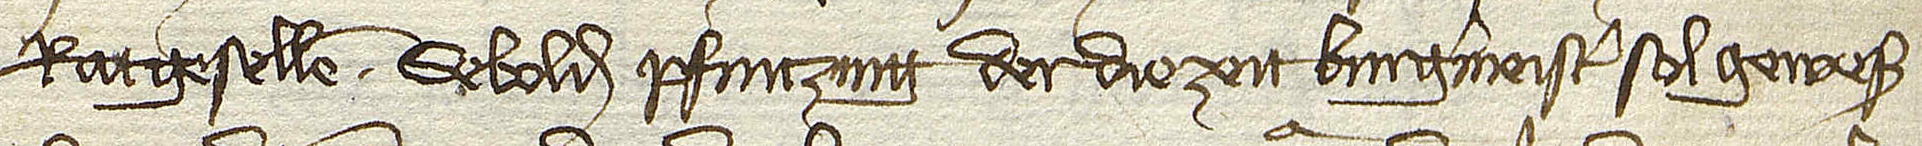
Ratgeſelle* . Sebold* pfincʒing der die ʒeit burg*meiſt* ſol geweſ*
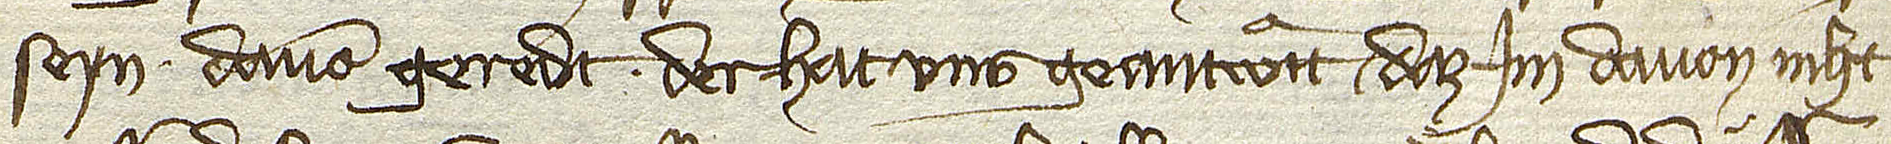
ſeyn . dauo* geredt . der hat vns geantw*tt / daʒ Im dauon niht
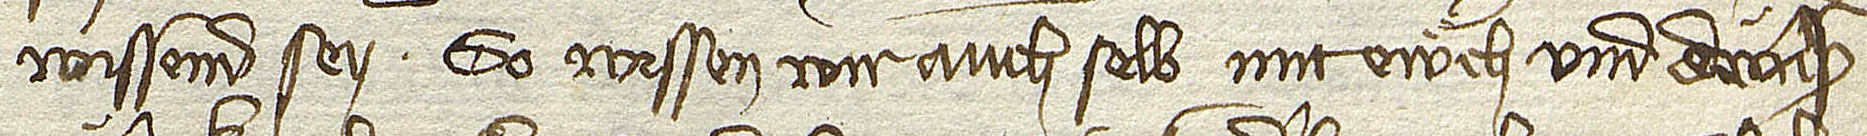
wiſſend ſey . So wiſſen wir auch ſelb mit ewch vnd demſ*
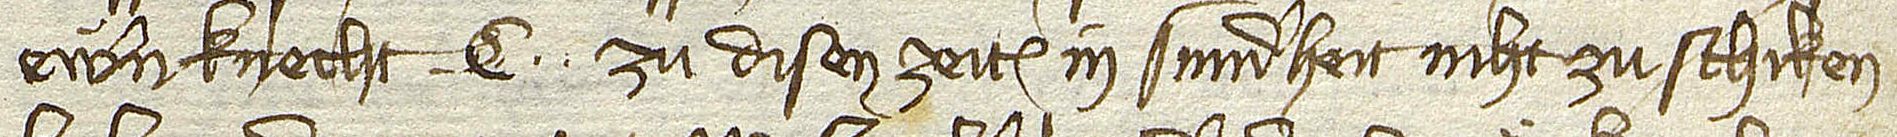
ew*n knecht . C . ʒu diſen ʒeit* in ſund*heit niht ʒu ſchiken
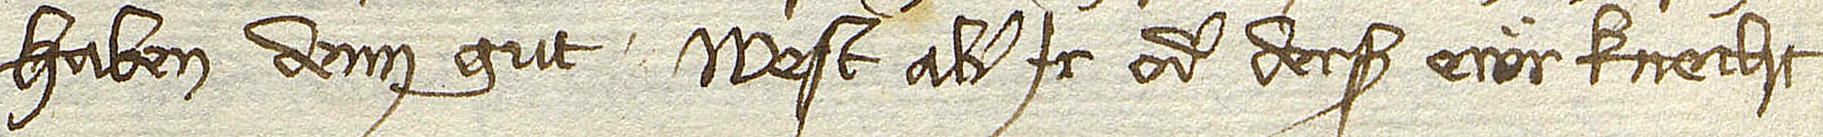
haben denn gut / Weſt ab* Ir od* derſ* ewr knecht
